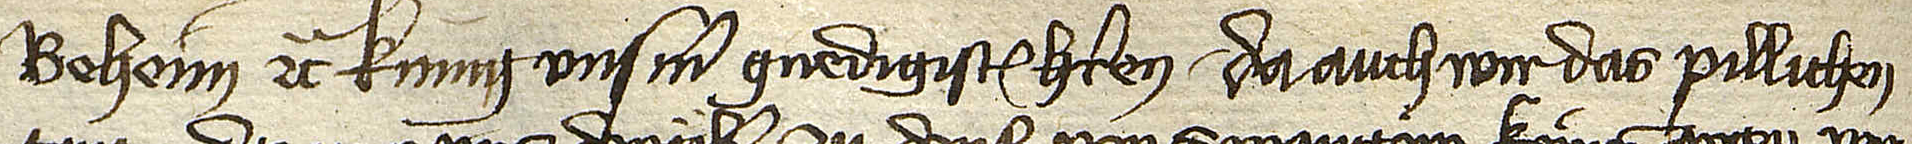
Beheim ec* kunig vnſm* gnedigiſt* h*ren / da auch wir das pillichen
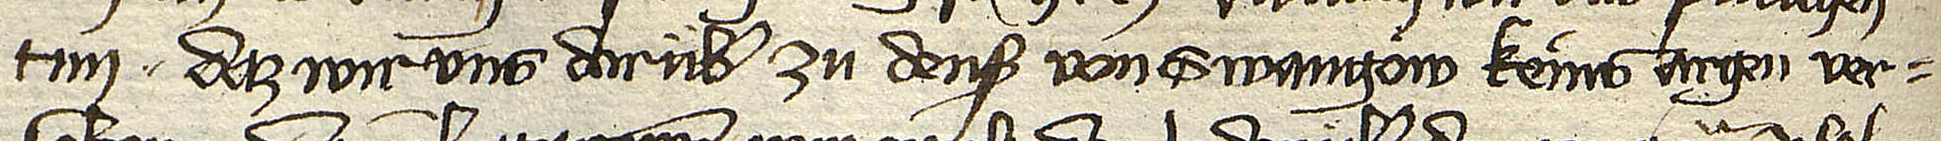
tun . / daʒ wir vns darüb* cʒu denſ* von Swangöw keins argen ver =
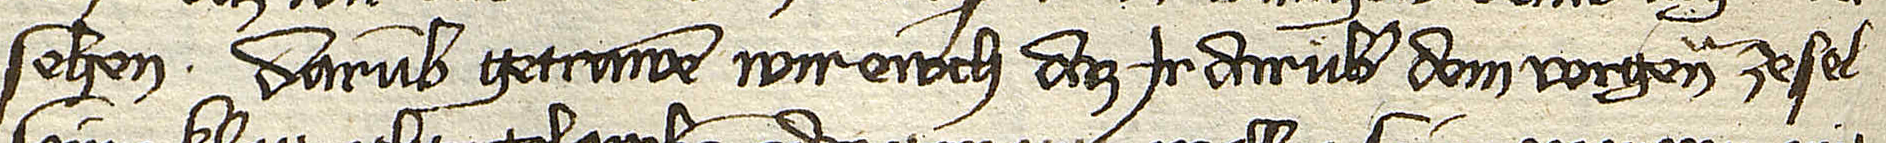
ſehen . Daru*b getrawe* wir ewch daʒ Ir darüb* dem vorgen* ʒeſel
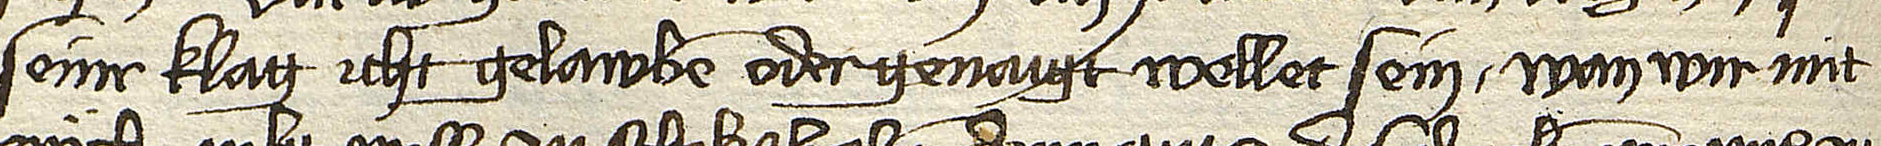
ſeinr klag icht gelawbe* oder genaigt wellet ſein / wan wir mit
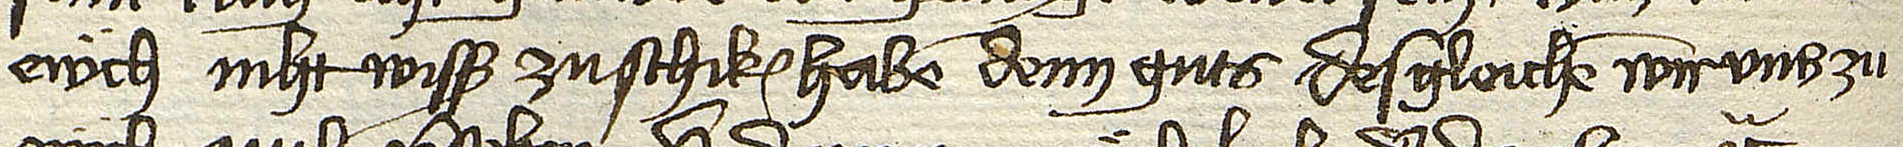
ewch niht wiſſ* ʒu ſchik* habe* denn guts / Deſgleiche* wir vns ʒu
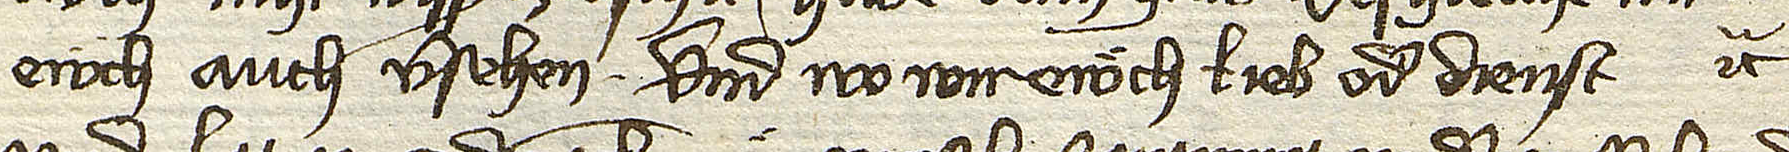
ewch auch v*ſehen . Vnd wo wir ewch lieb od* dienſt ec*
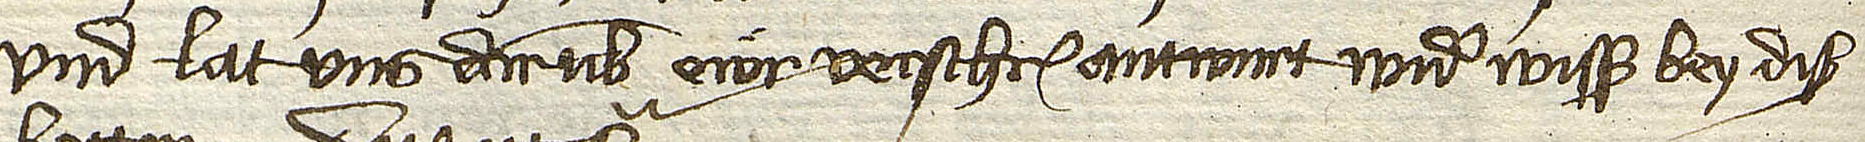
vnd lat vns daru*b ewr verſchr* antwurt wid* wiſſ* bey diſ*
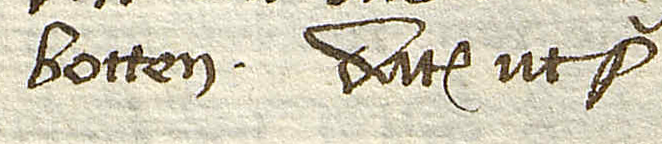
botten . Dat* ut ſ*
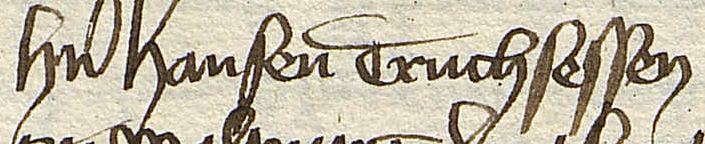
hn* Hanſen Truchſeſſen
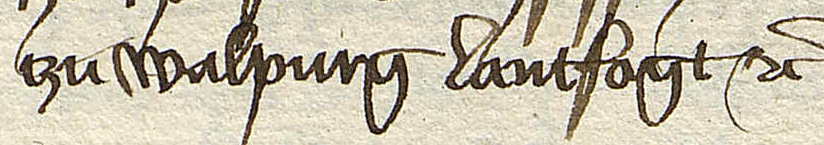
cʒu walpurg lantfogt ec*
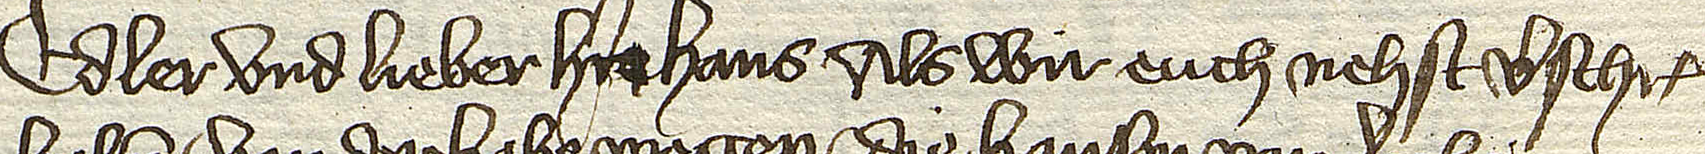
Edler vnd lieber hr*e hans Als wir euch nehſt v*ſchr*
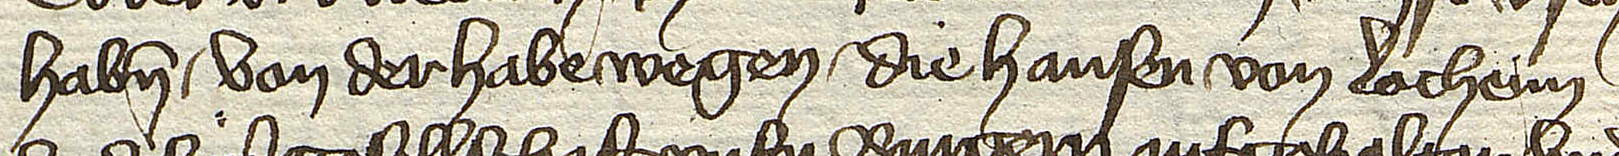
habn* / von der habe wegen / die hanſen von Locheim
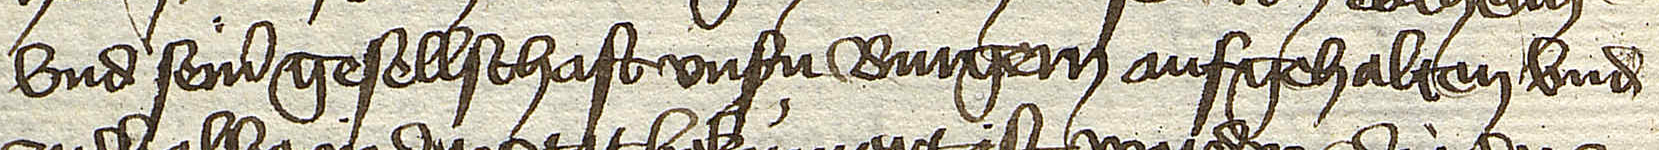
vnd ſein* geſellſchaft vnſn* Burgern aufgehalten vnd
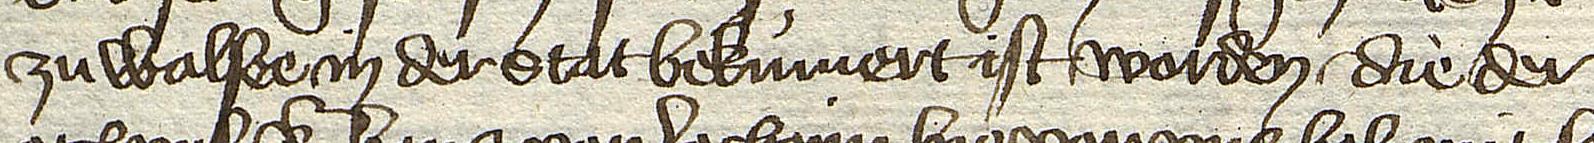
cʒu walſee in der Stat bekümert iſt worden / die der
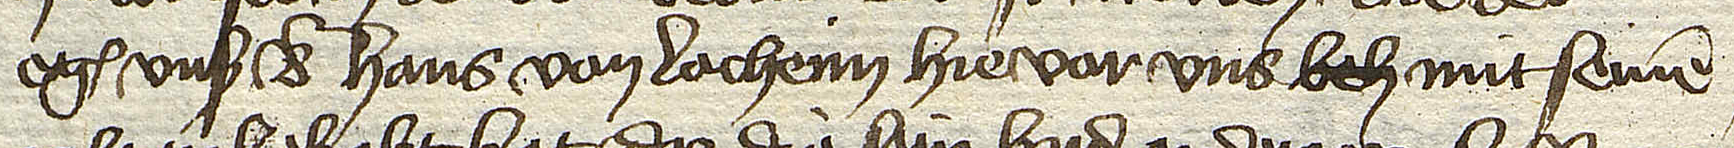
eg* vnſ* B* hans von Locheim hie vor vns beh mit ſeine*
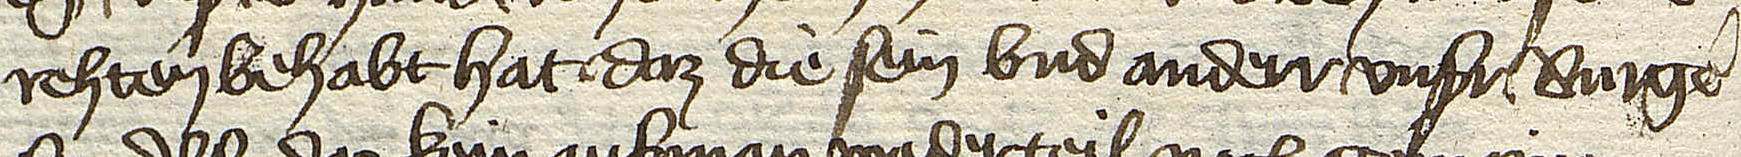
rehten behabt hat / daʒ die ſein vnd anderr vnſr* Burge*
